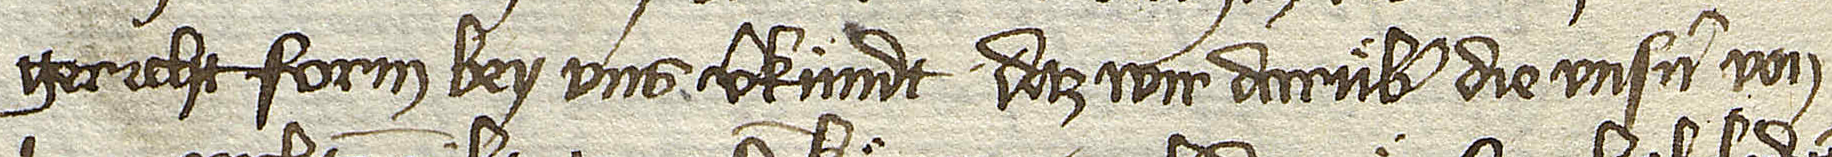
gericht form bey vns v*kündt / Daʒ wir darüb* die vnſn* von
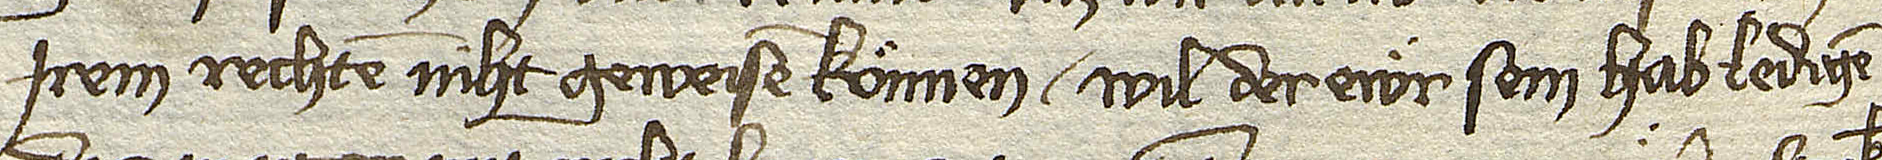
Irem rechte* niht geweiſe* können / wil der eẅr ſein hab ledige*
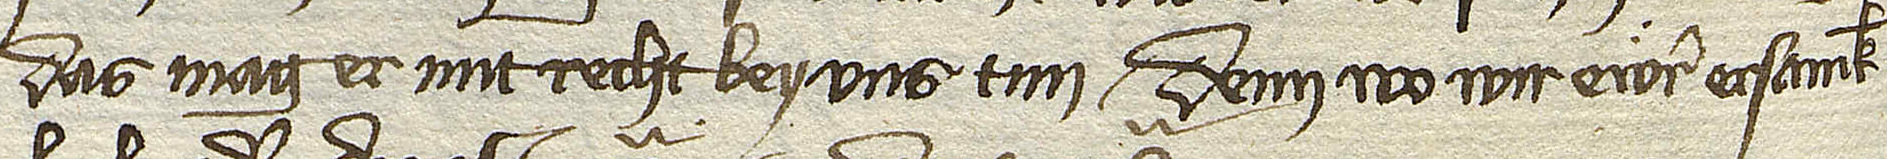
Das mag er mit recht bey vns tun / Denn wo wir eẅr* erſamk*
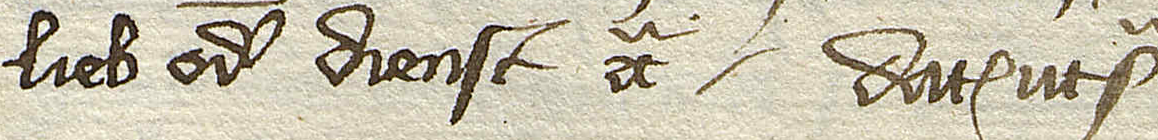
lieb od* dienſt ec* / Dat* ut ſ*
